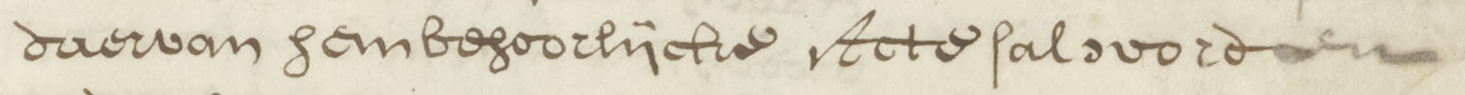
daervan hem behoorlijcke Acte sal worden
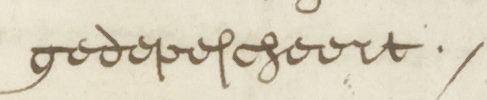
gedepescheert.
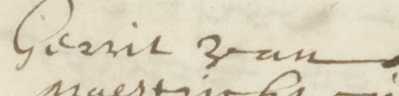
Gerrit van
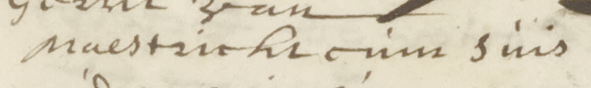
Maestricht cum suis
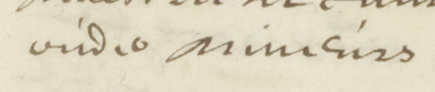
ende mineurs
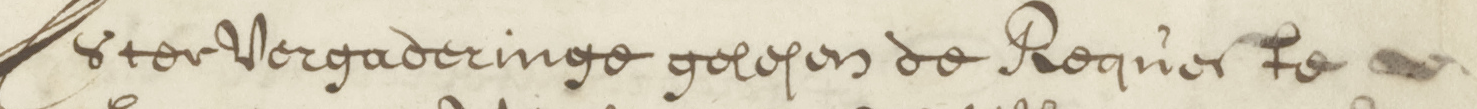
Is ter Vergaderinge gelesen de Requeste van
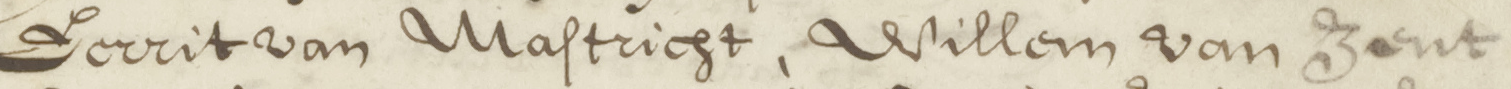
Gerrit van Mastricht, Willem van Zent,
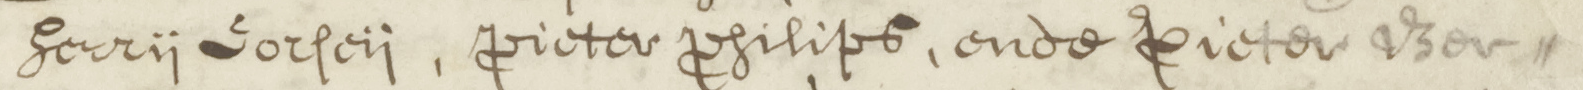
Herrij Corseij, Pieter Philips, ende Pieter Ber„
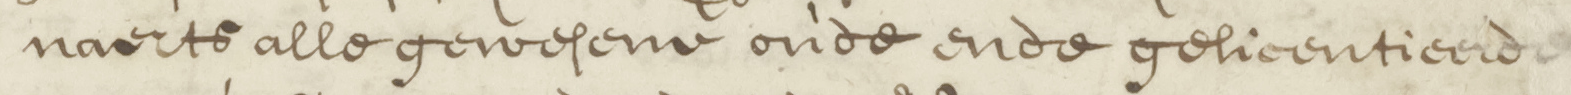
naerts alle gewesene oude ende gelicentieerde
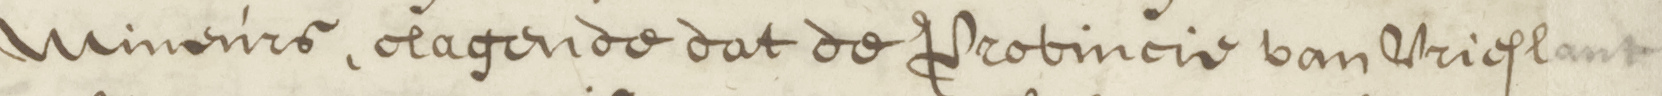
Mineurs, clagende dat de Provincie van Vrieslant
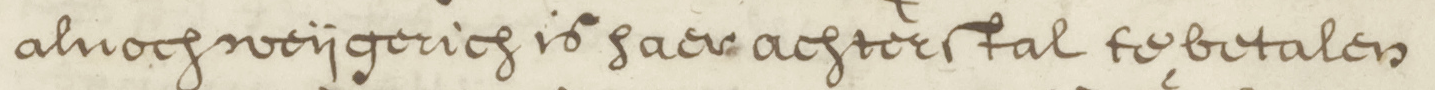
alnoch weijgerich is haer achterstal te betalen,
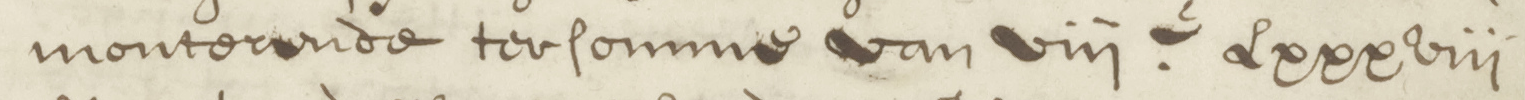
monterende ter somme van viiic lxxxviii L.
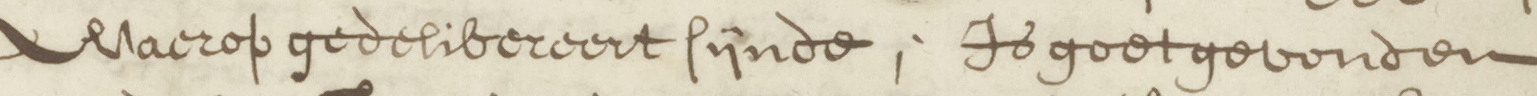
Waerop gedelibereert sijnde, Is goetgevonden
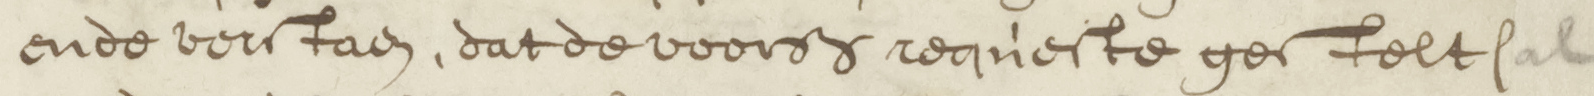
ende verstaen, dat de voors requeste gestelt sal
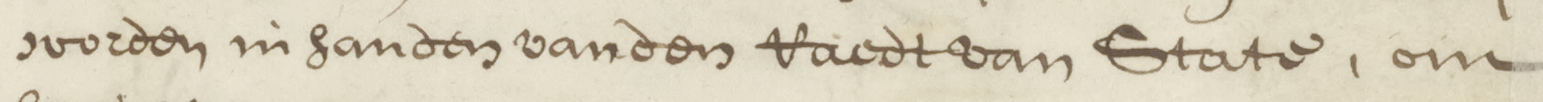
worden in handen vanden Raedt van State, om
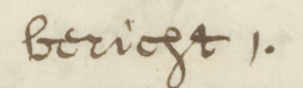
bericht.
